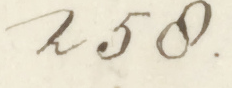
258.
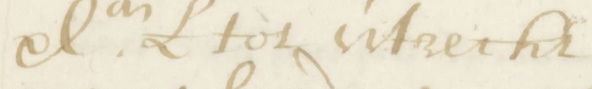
xlm L tot Utrecht
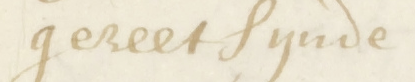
gereet synde
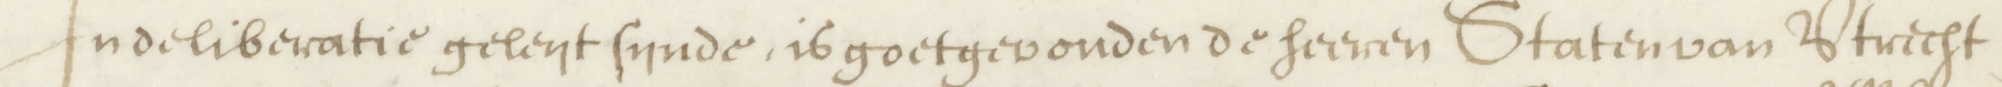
In deliberatie geleyt synde, is goetgevonden de heeren Staten van Utrecht
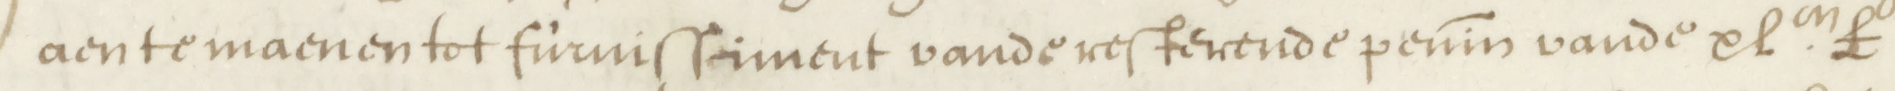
aen te maenen tot furnissiment vande resterende penin vande xlm L
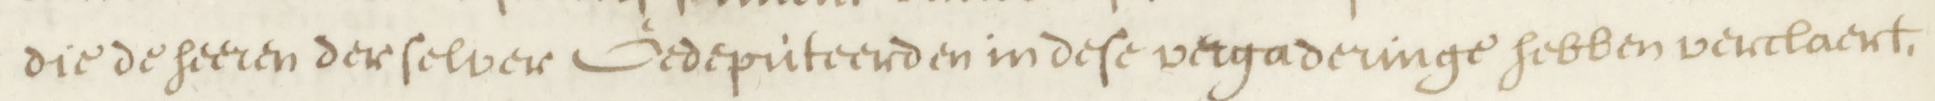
die de heeren der selver Gedeputeerden in dese vergaderinge hebben verclaert,
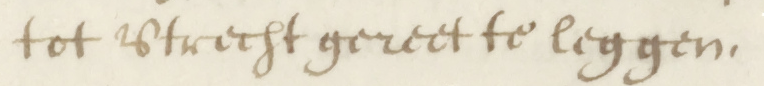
tot Utrecht gereet te leggen.
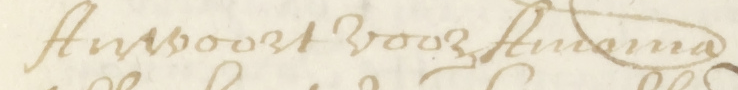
Anwoort voor Amama
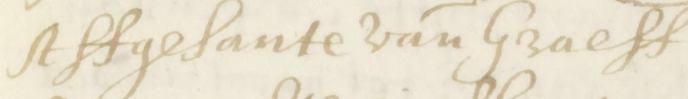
Affgesante van Graeff
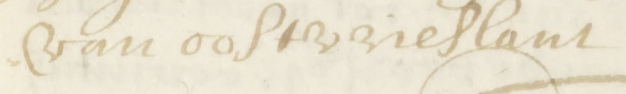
van oostvrieslant
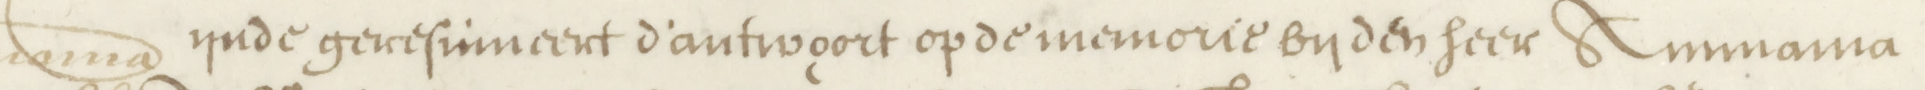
Synde geresumeert d'antwoort opde memorie by den heer Ammama —
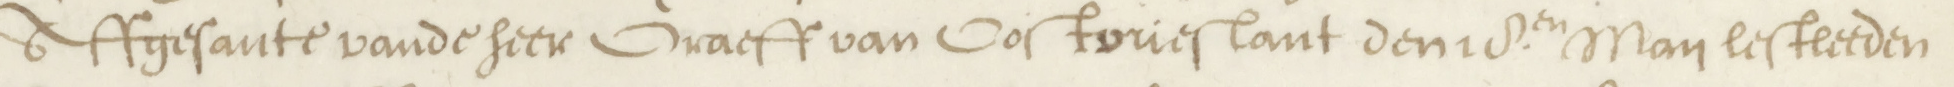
Affgesante vande heer Graeff van Oostvrieslant den 18en. May lestleeden
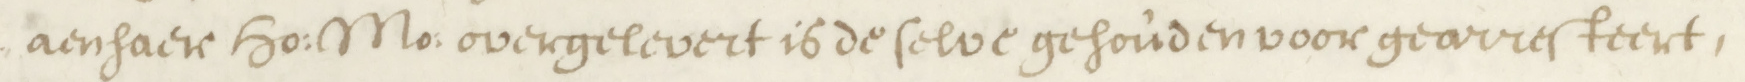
aen haer Ho:Mo: overgelevert is de selve gehouden voor gearresteert.
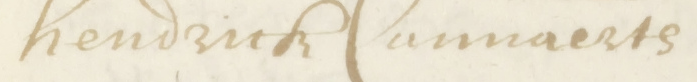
hendrick Cannaerts
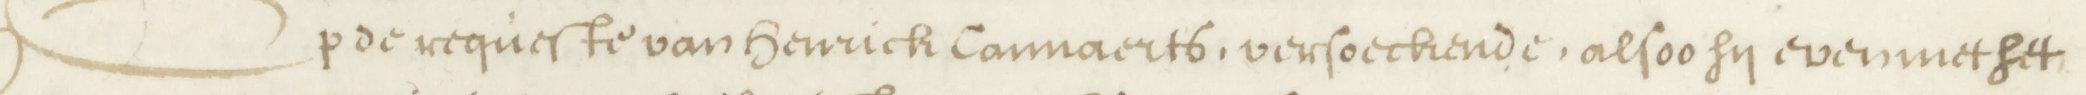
Opde requeste van Henrick Cannaerts, versoeckende, alsoo hy even met het
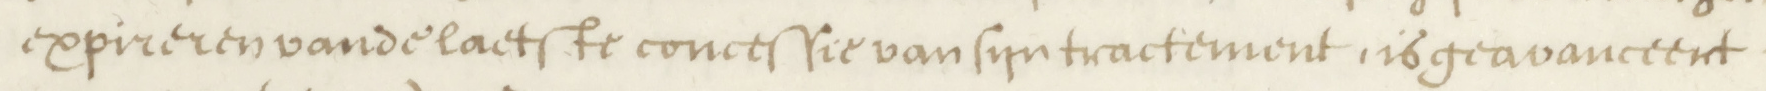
expireren vande laetste concessie van syn tractement, is geavanceert —
